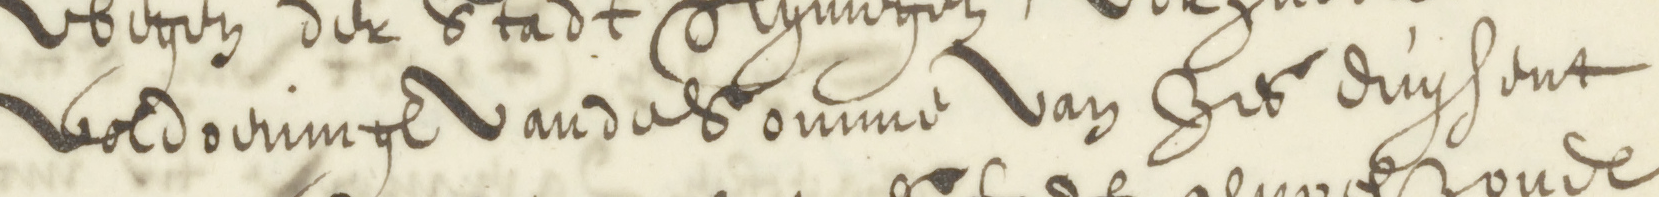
voldoening vande somme van zes duysent
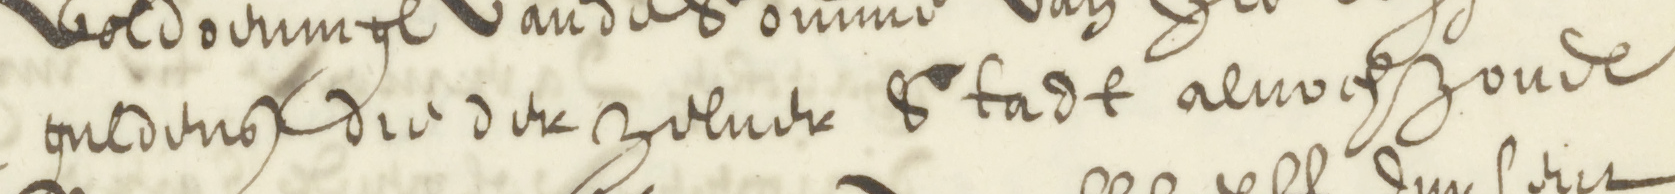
guldens die der zeluer stadt alnoch zoude
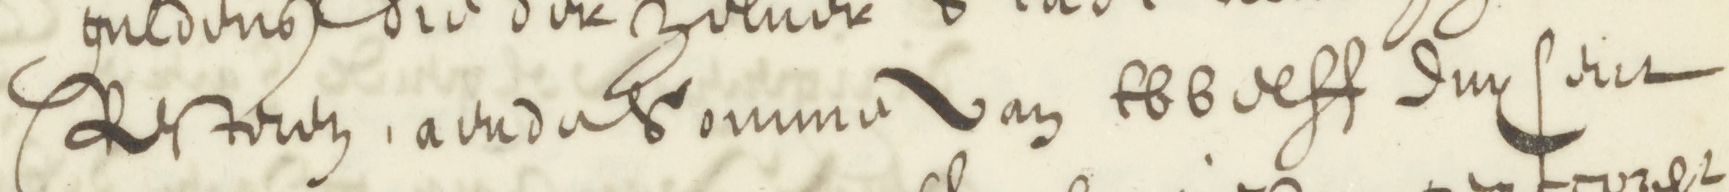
Resteren, aende somme van twelff duysent
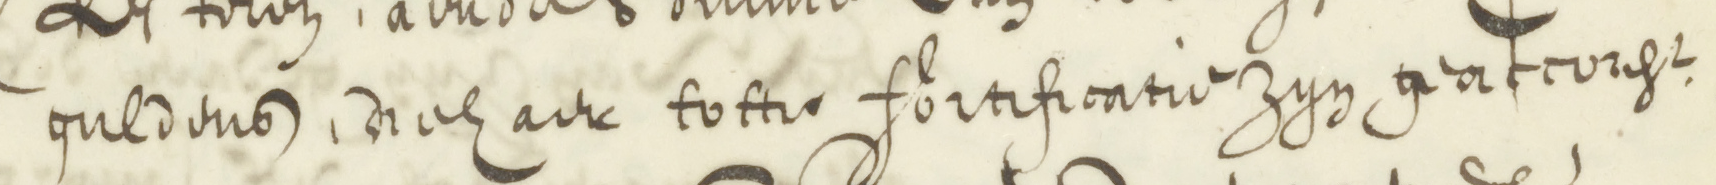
guldens, die haer totte fortificatie zijn geaccordt.
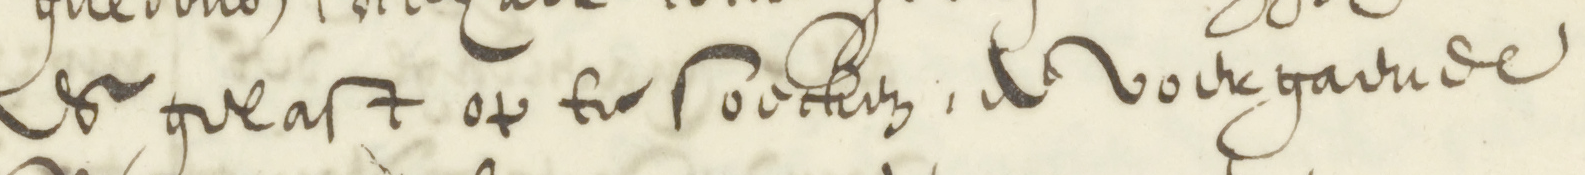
Es gelast op te soecken de voorgaende
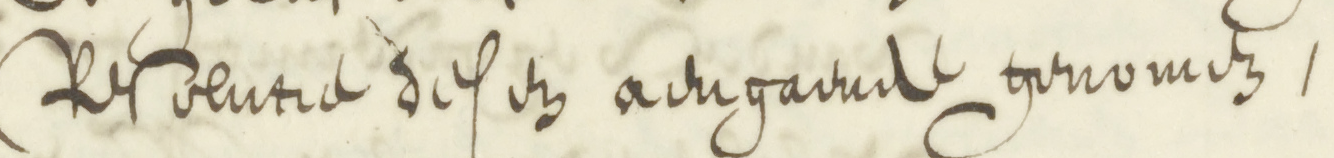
Resolutie desen aengaende genomen.
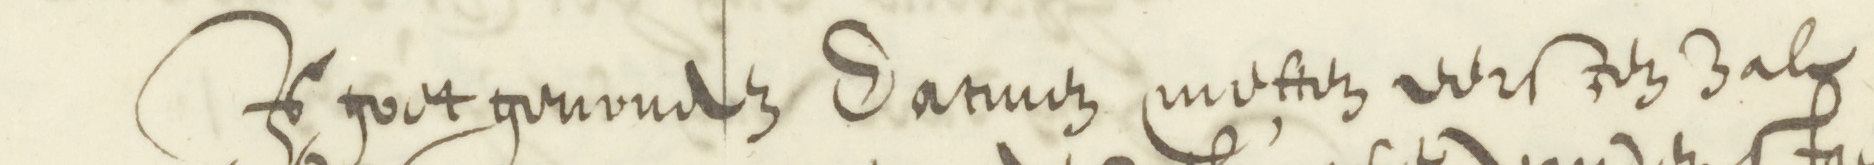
Is goet geuonden datmen metten eersten zal
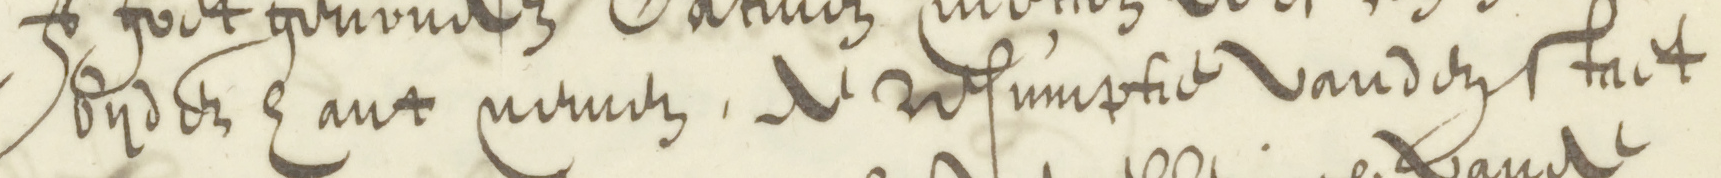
bijden hant nemen, de resumptie vanden staet
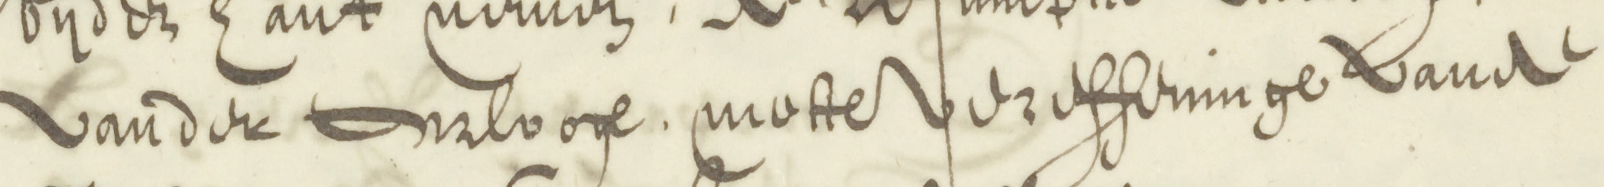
van der Oirloogh mette vereffening vande
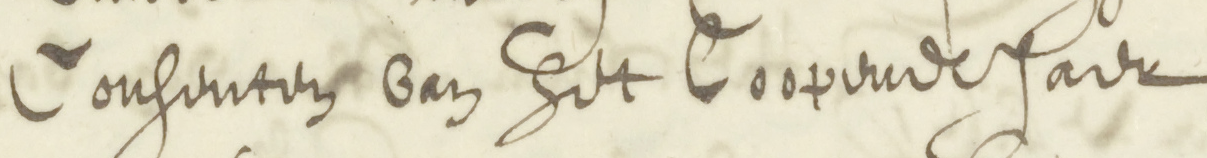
consenten van het loopende jaer.
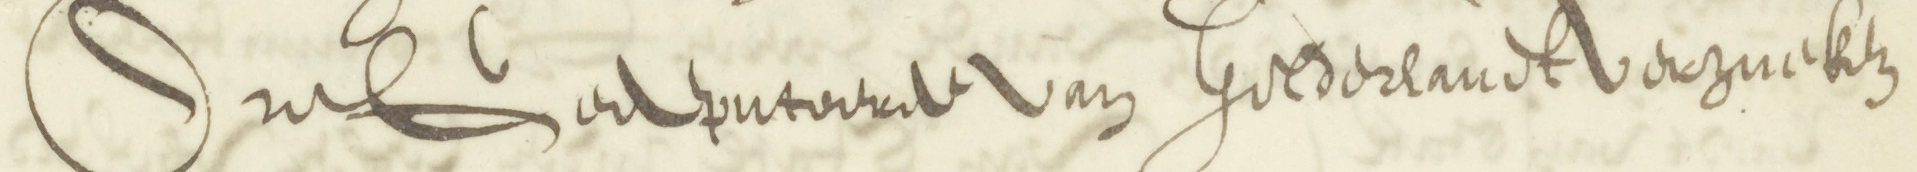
Die Gedeputeerde van Gelderlandt verzueken
